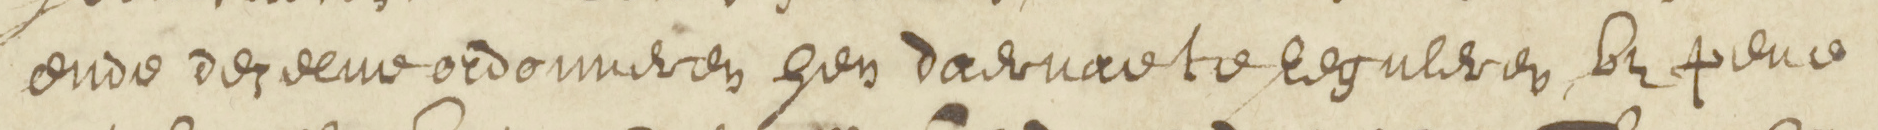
ende dezelue ordonneren hen daernae te reguleren, by pene
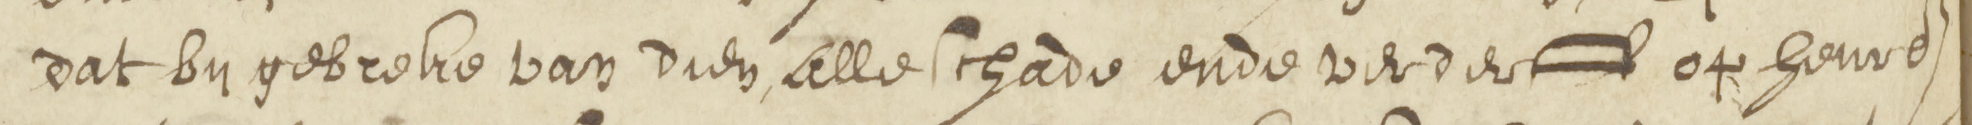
dat by gebreke van dien, alle schade ende verderff op heurl
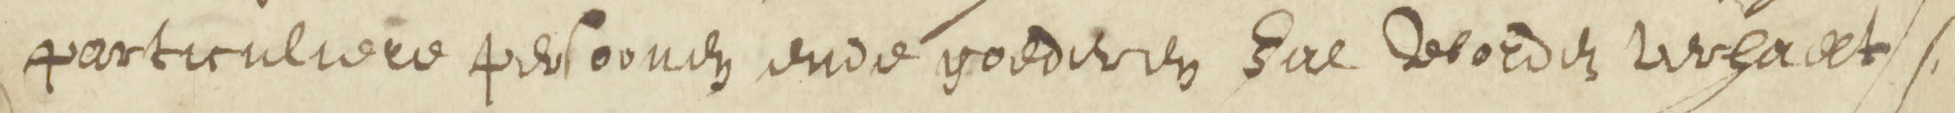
particuliere persoonen ende goederen zal worden verhaelt.
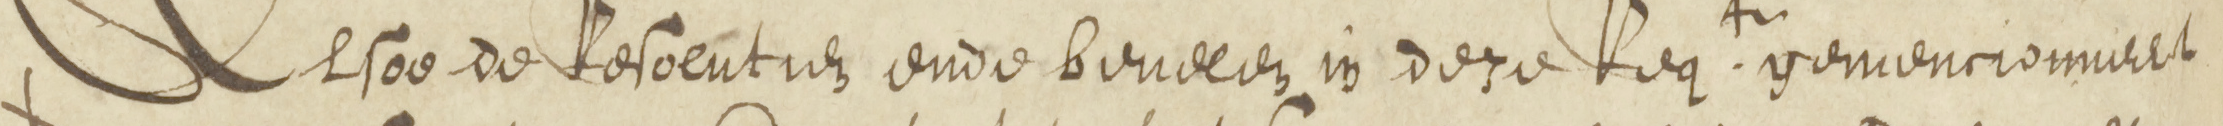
Alsoe de Resolutien ende beuelen in deze Reqte. gementionneert
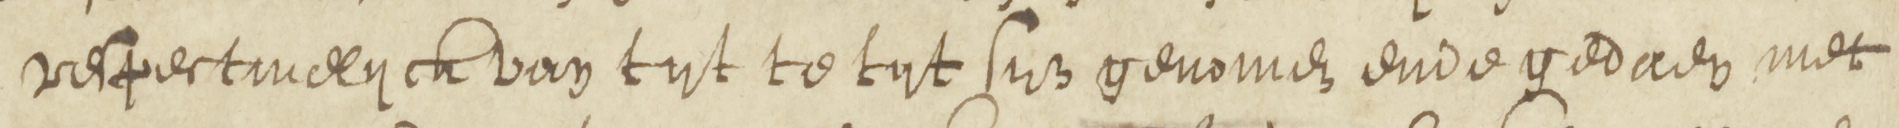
respectiuelyck van tyt te tyt syn genomen ende gedaen met
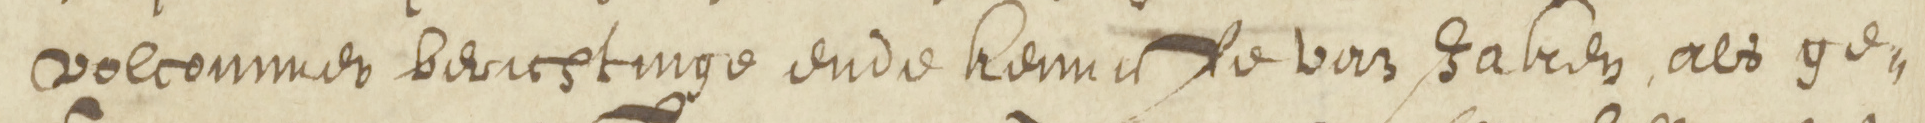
volcommen berichtinge ende kennisse van zaken, als ge„
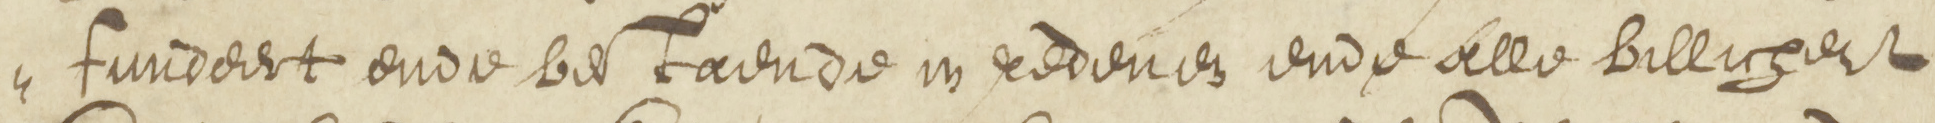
„fundeert ende bestaende in redenen ende alle billicheyt
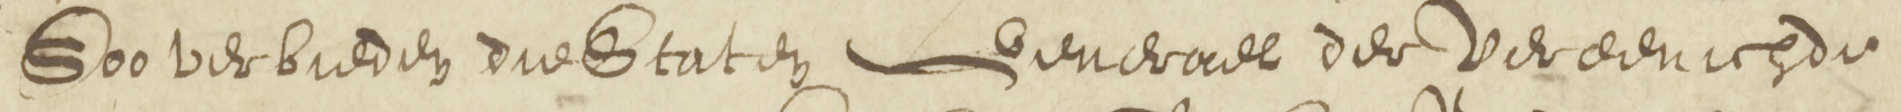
Soo verbieden die Staten Generael der Vereenichde
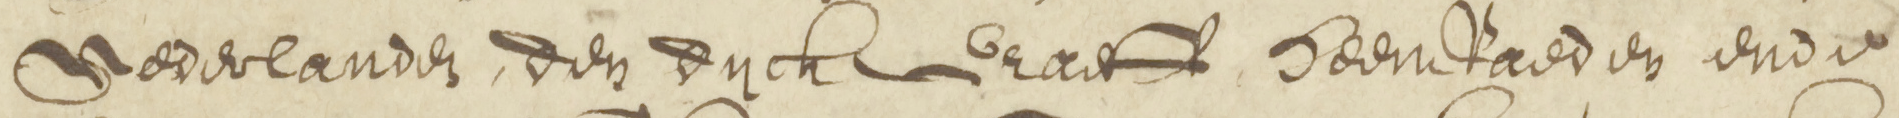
Nederlanden, den dyckgraeff, Heemraeden ende
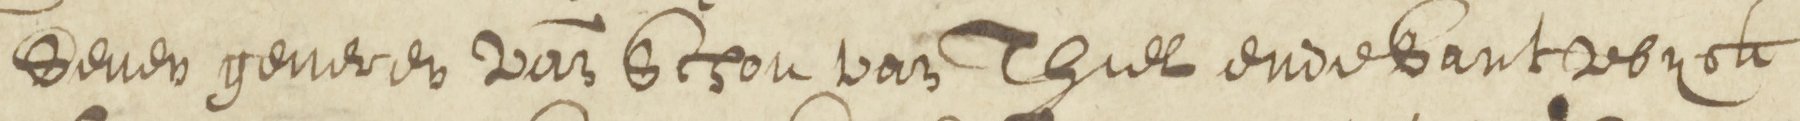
Seuen geueren van Schou van Thiel ende Santwyck
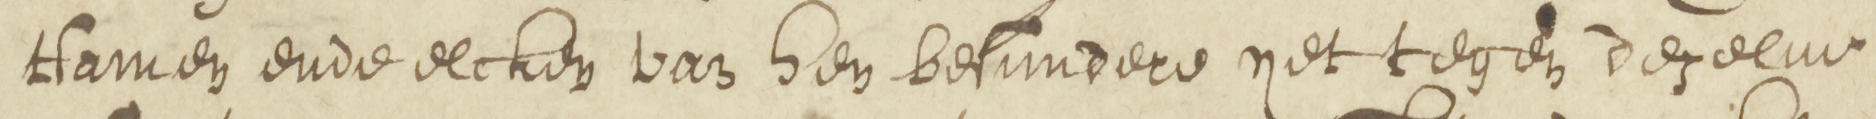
tsamen ende elcken van hen besundere nyet tegen dezelue
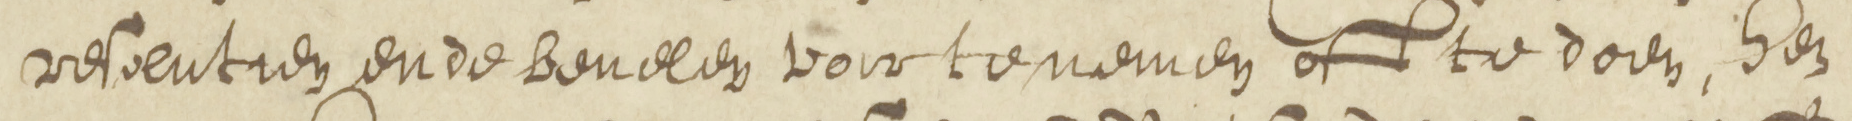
resolutien ende beuelen voir te nemen offte doen, hen
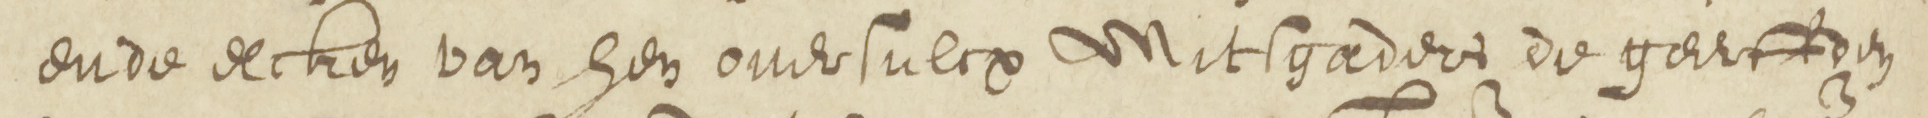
ende elcken van hen ouersulcx Mitsgaders de geerffden
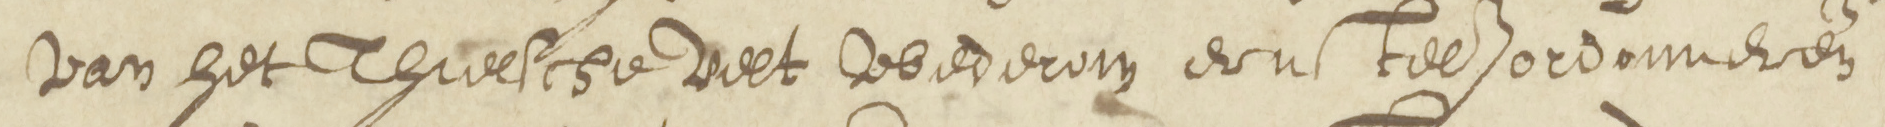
van het Thielsche Velt wederom ernstel ordonneren
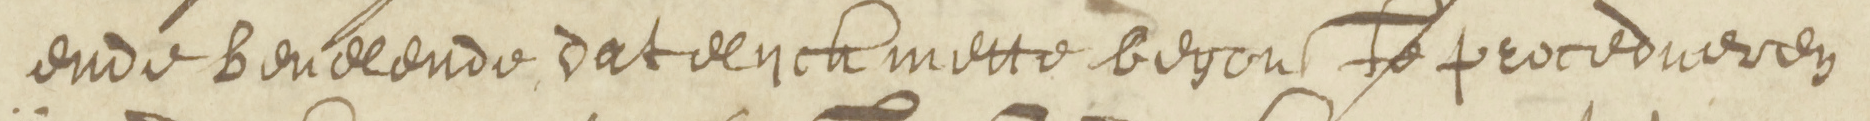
ende beuelende datelyck mette begonste procedueren
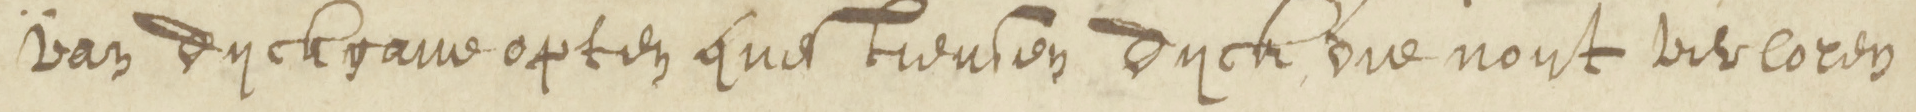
van dyckgrave opten questieusen dyck die noyt verloren
